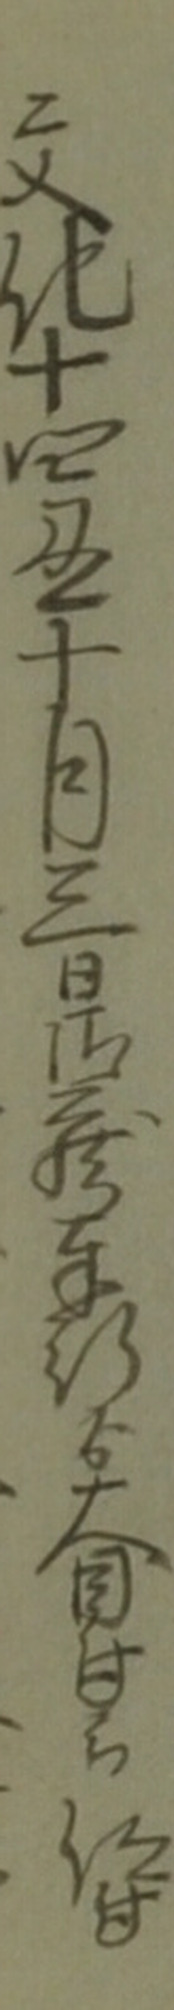一文化十四丑十月三日御蔵奉行ゟ大目付被仰付
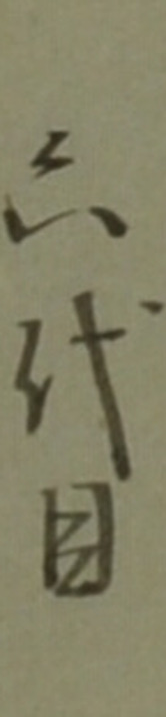六代目
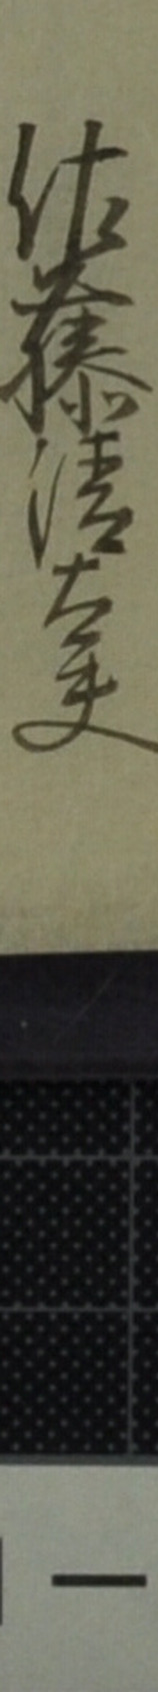佐藤清太夫
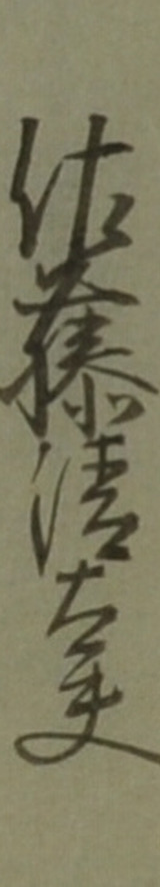佐藤清太夫
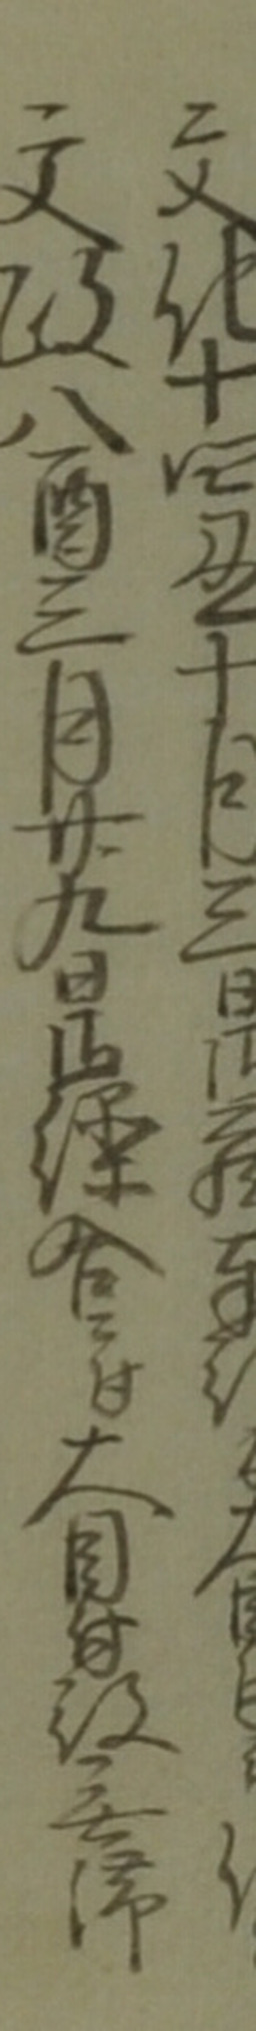一文政八酉三月廿九日御繰合ニ付大目付役無滞
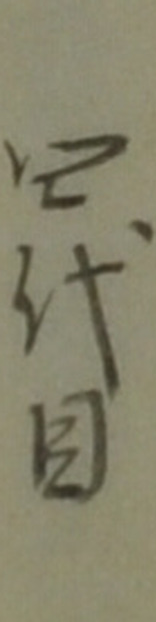四代目
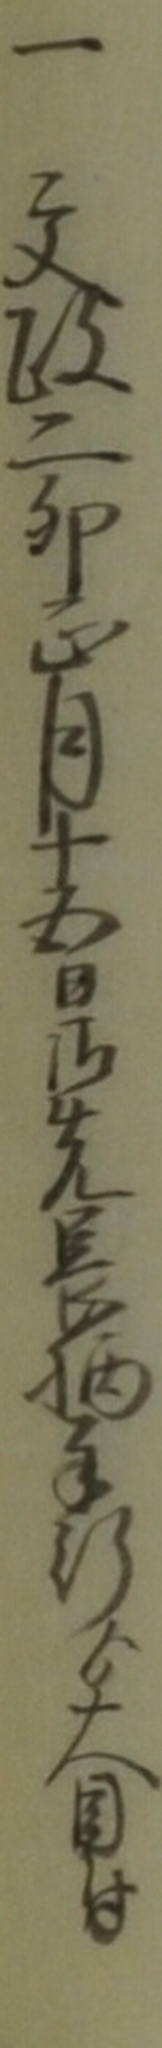一文政二卯正月十五日御先手長柄奉行ゟ大目付
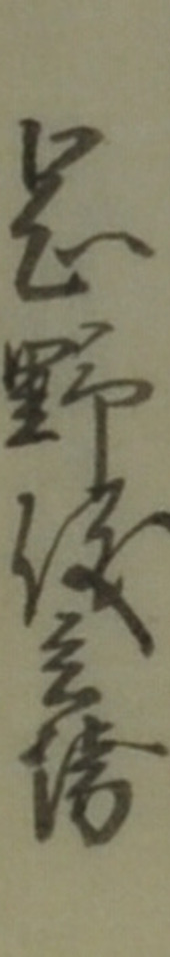岡野儀兵衛
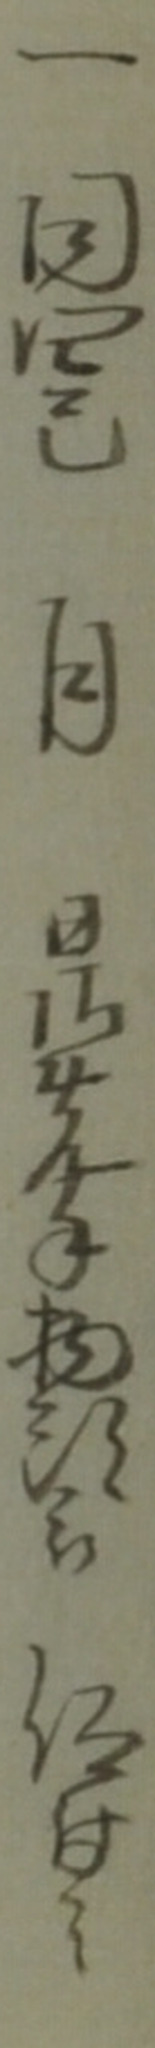一同四己月日御先手物頭被仰付之
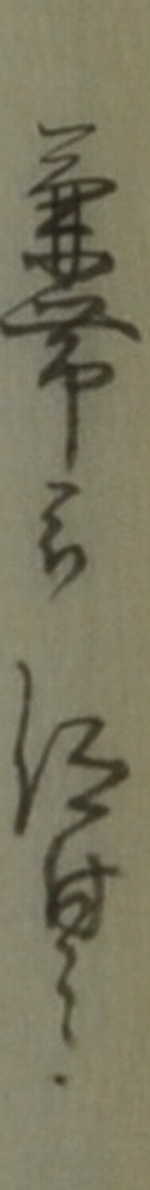兼帯被仰付之
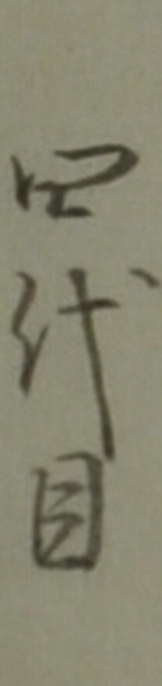四代目
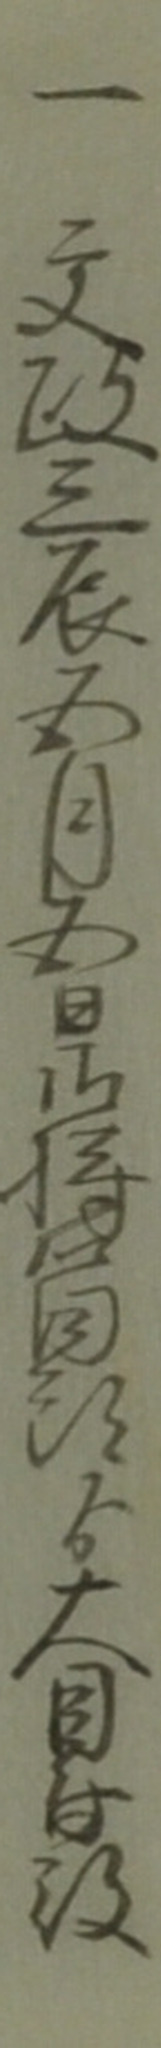一文政三辰五月五日御持筒頭ゟ大目付役
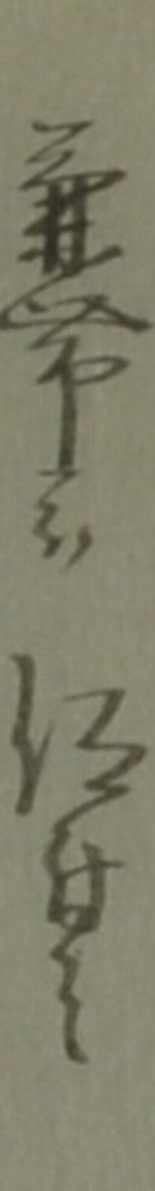兼帯被仰付之
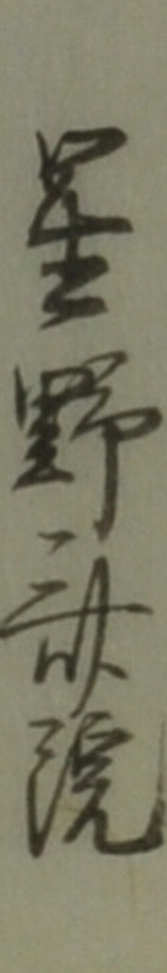星野斎院
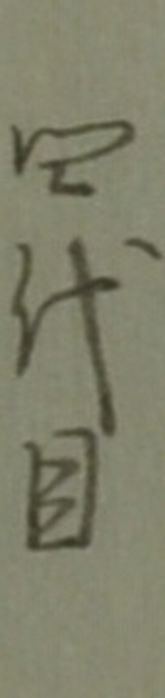四代目
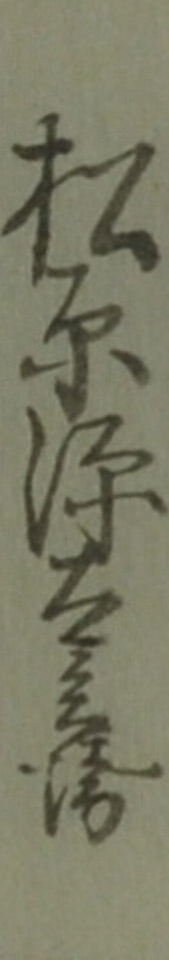松原源太兵衛
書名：諸御役代々録（三）
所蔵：伊那市立高遠町図書館・合同会社AMANE
